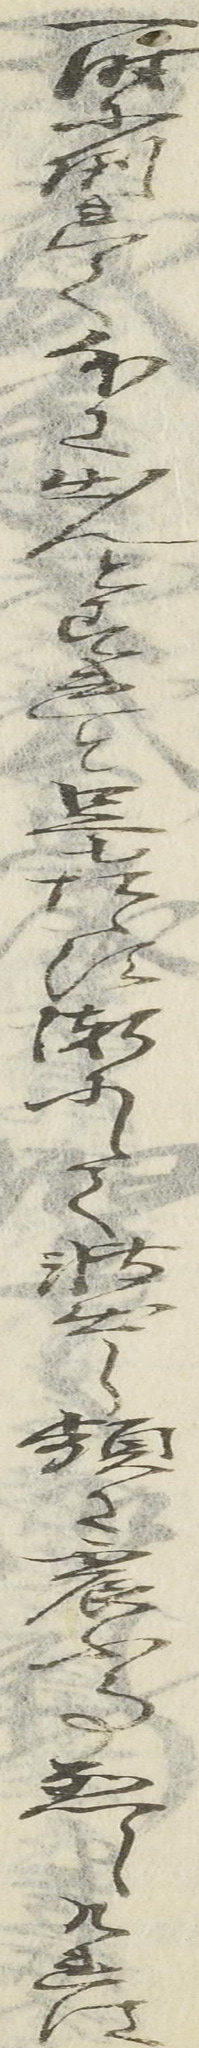一時に倒れて外に出んとすれと足もたゝす漸にして轉出し頻に震ふる事烈しケれは
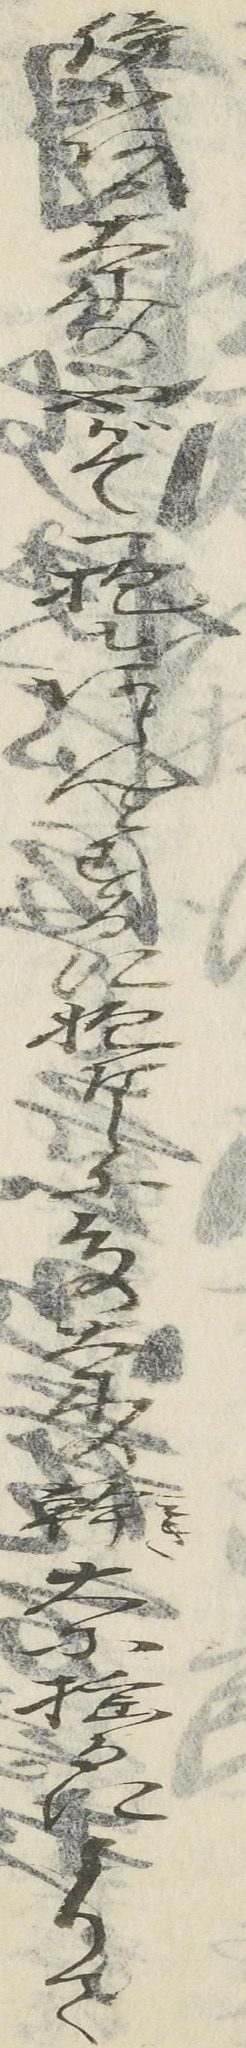傍にある大木のやがて一抱もあらんとするに抱付しにその大木の幹ミき大に揺るによりて
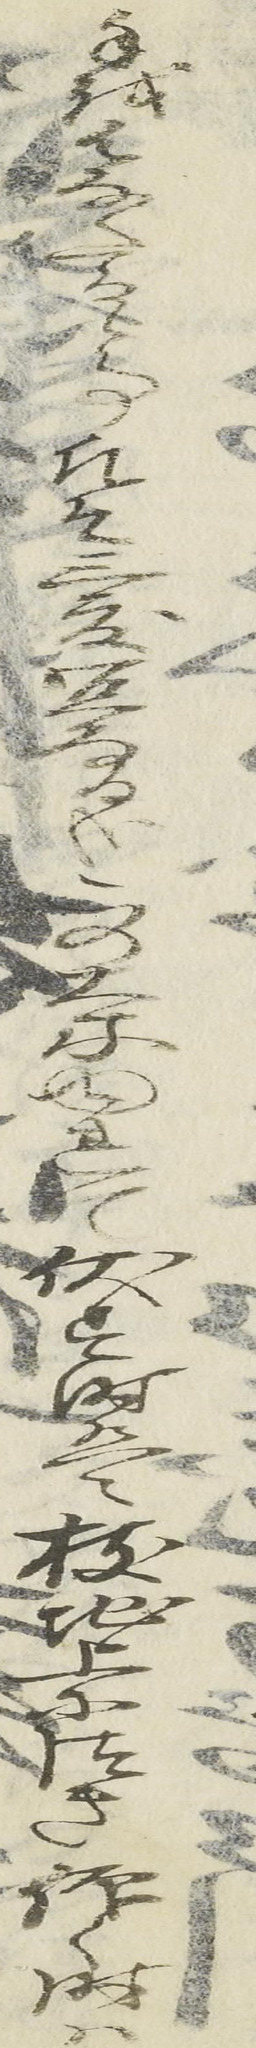手をはなたるゝ事凡そ三度亘なる哉この大木ゆれて伏す時は枝地上につき仰く時ハ
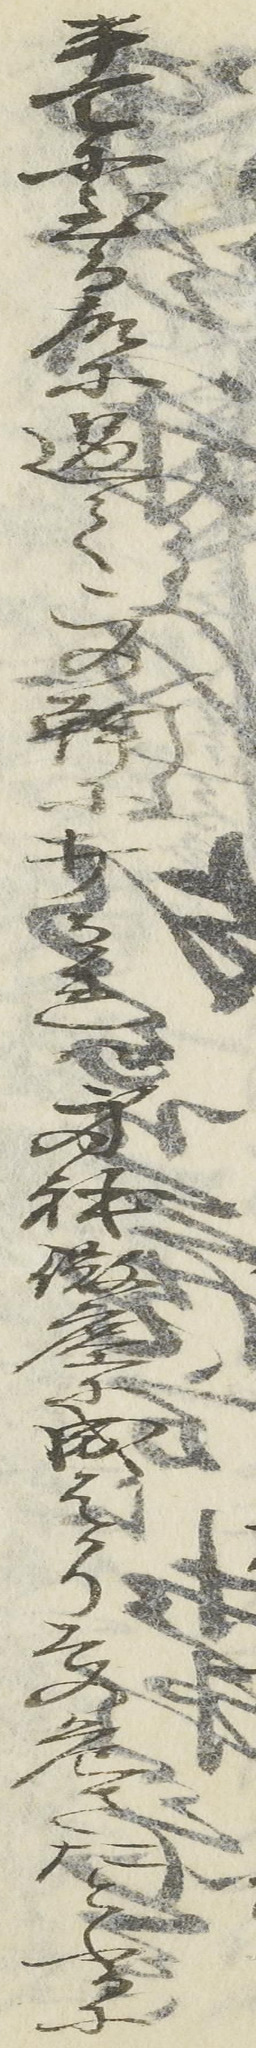半天に至る故に過てこの幹に打るれハ身躰微塵に成そケりその危さたとふるに
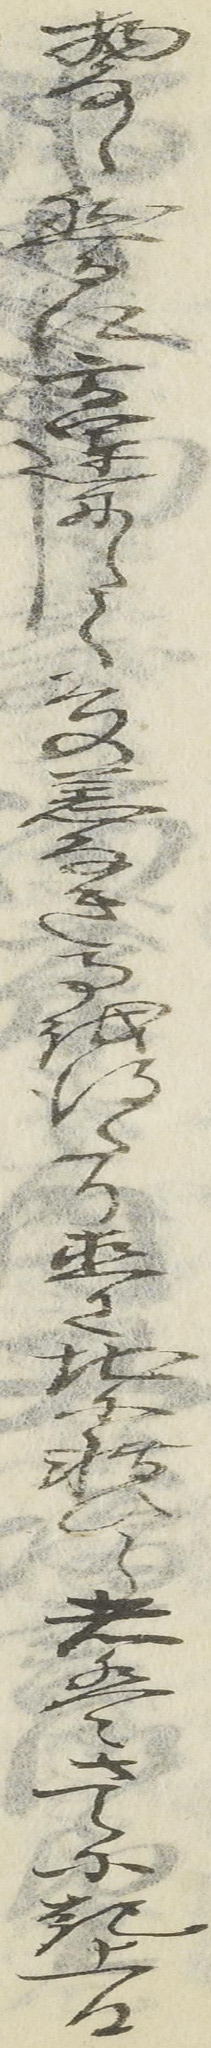物なし然るに高運にしてその恙なき事を得たり直に地に轉ひし者はさらに起上る
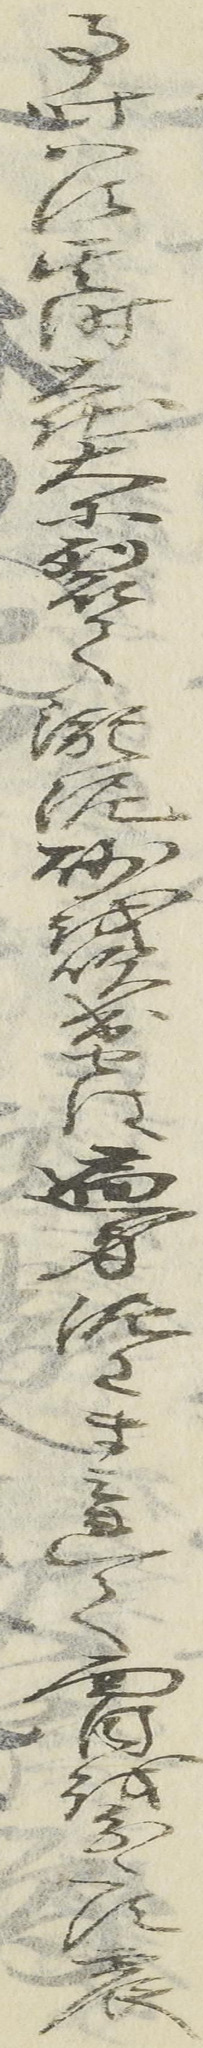事叶ハす其時大地大に裂て淤泥砂を吹出セは遍身泥にまミれて面目を分たす震

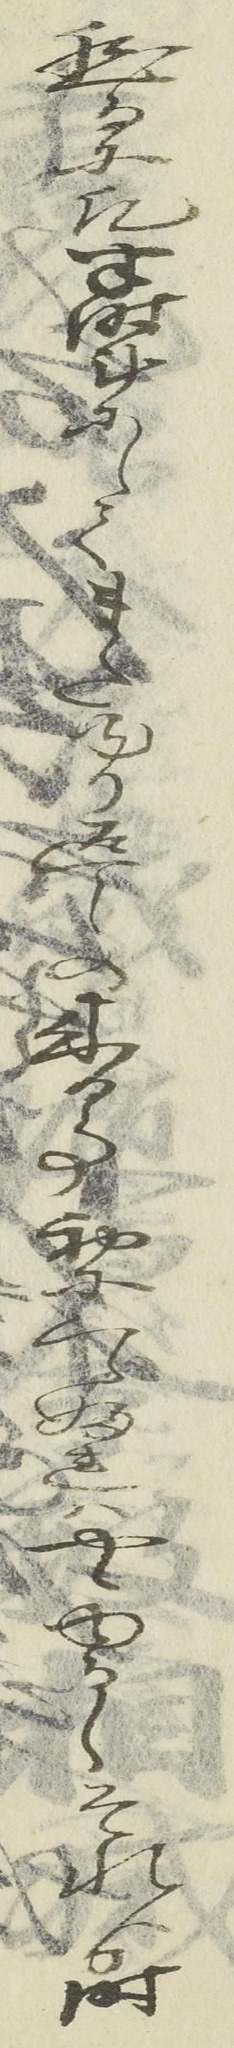然るに凡半時斗にしてまたゆり返しの来る事初にくらふれハやゝゆるしそれゟ時
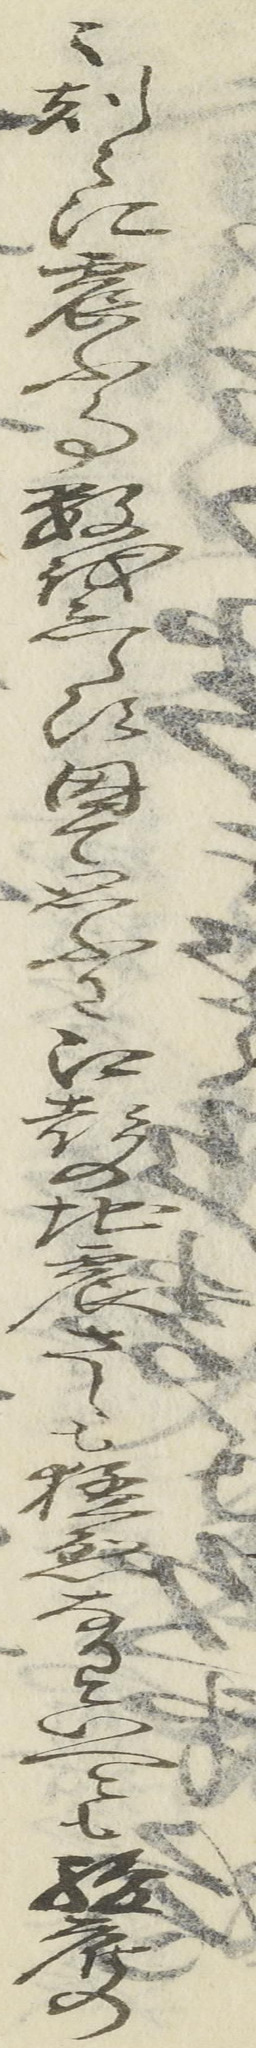々刻々に震ふ事数をしらす因て思ふに江都の地震さしも猛烈なりといへとも駿府の
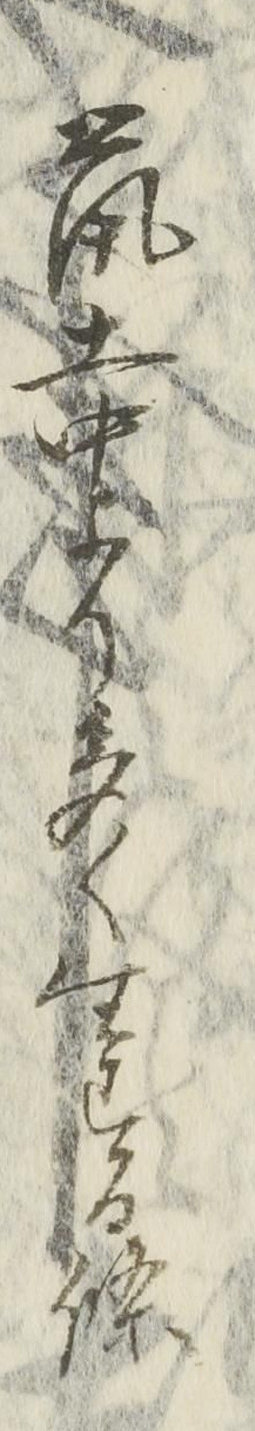鼠土中より多く生する條
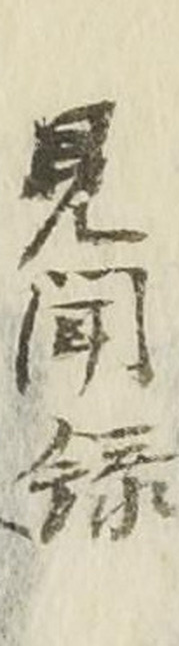見聞録
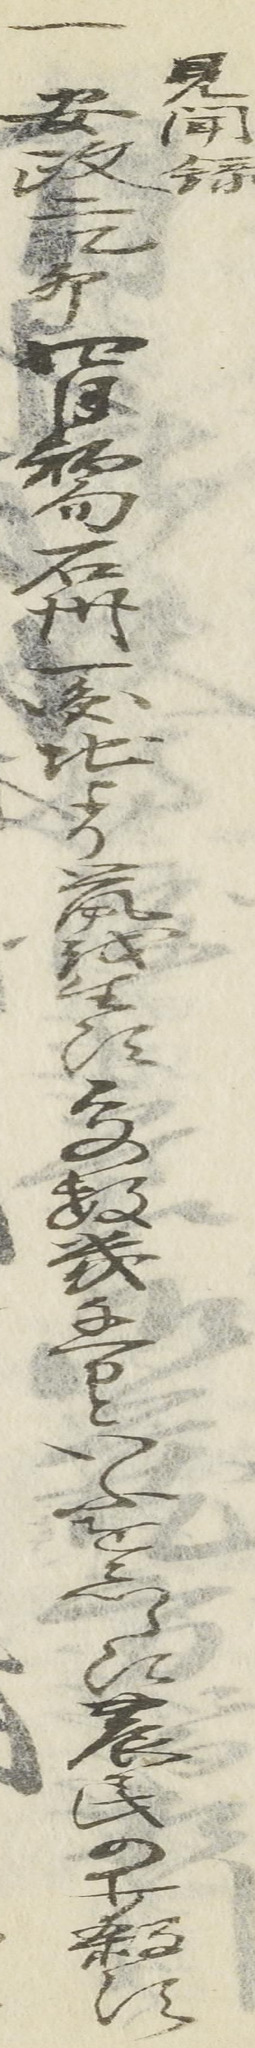一安政ニ乙卯四月初旬石州一円地より鼠を生すその数幾千万といふをしらす農民の打殺す
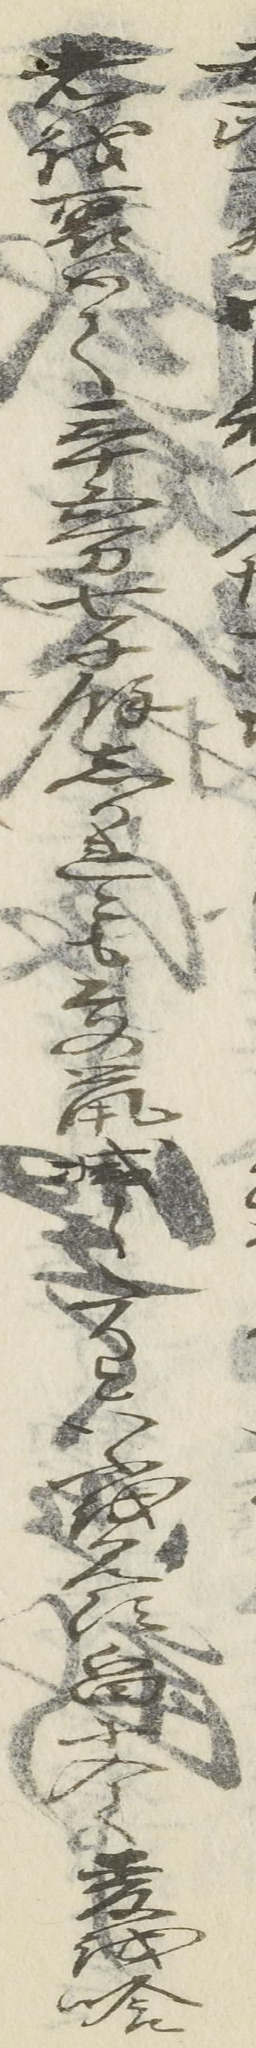者を聚めて三十五万七千余しかれともその鼠減したりといふを見す畠に入て麦を喰
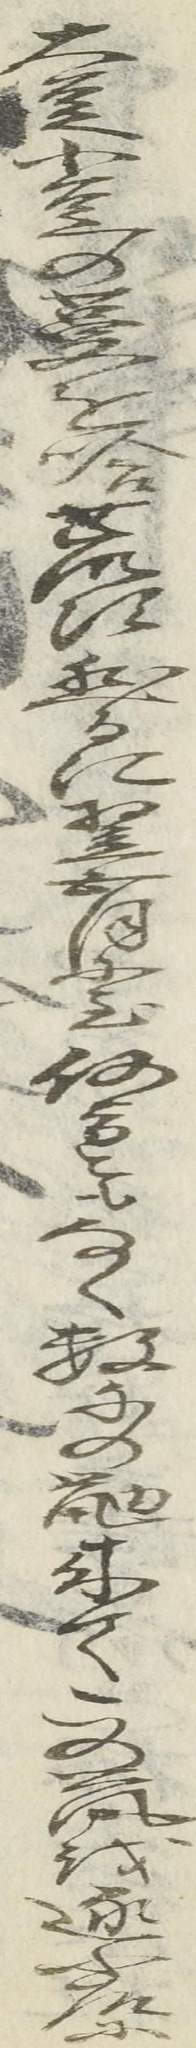大豆小豆の蔓を喰荒す然るに翌五月に至何方ともなく数千の鼬来てこの鼠を逐ふ故に
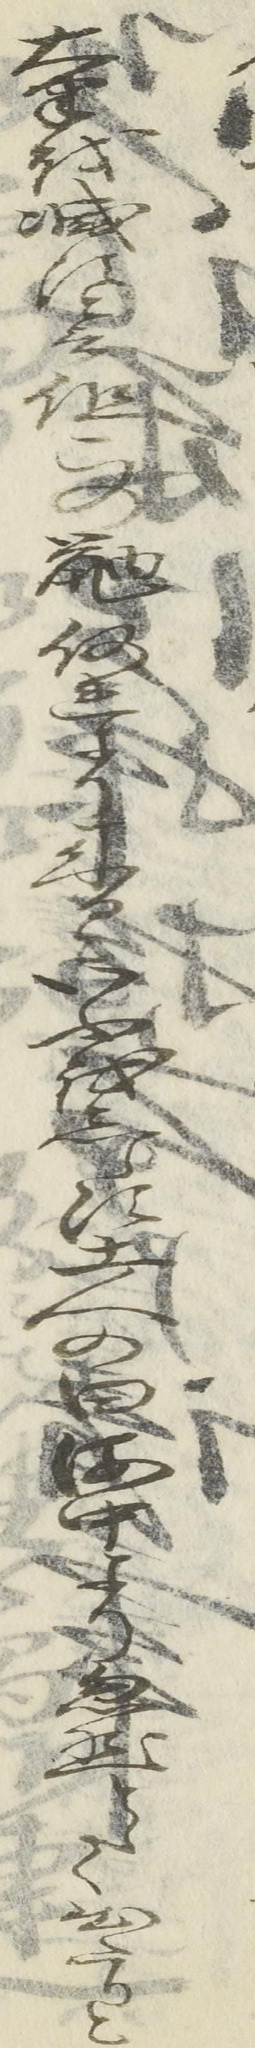大半を滅すと云但この鼬何れより来るといふをしらす土人の曰海中より忽然として出たりと
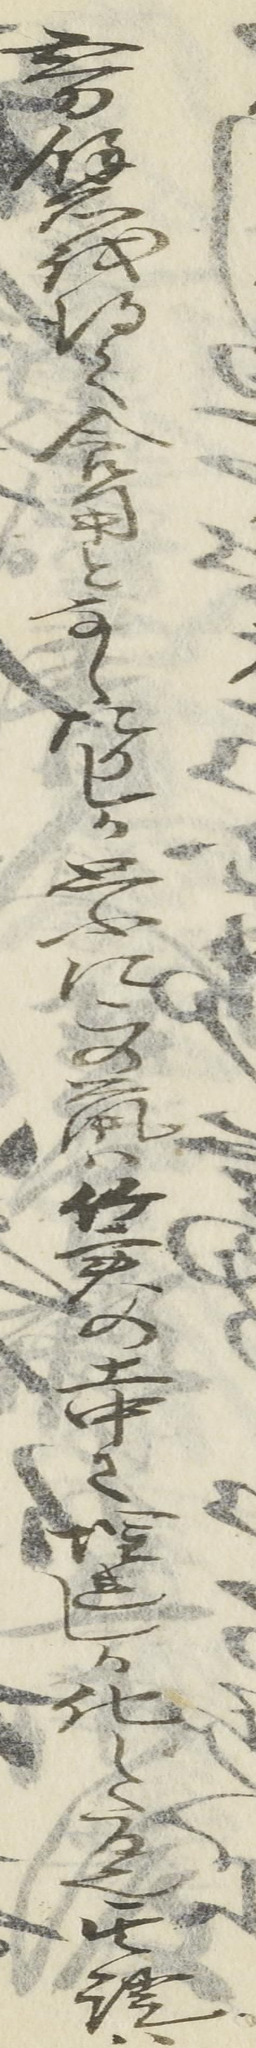五万余石を得て食用となしたりしか思ふにこの鼠ハ竹実の土中に埋れしか化したる也其証ハ
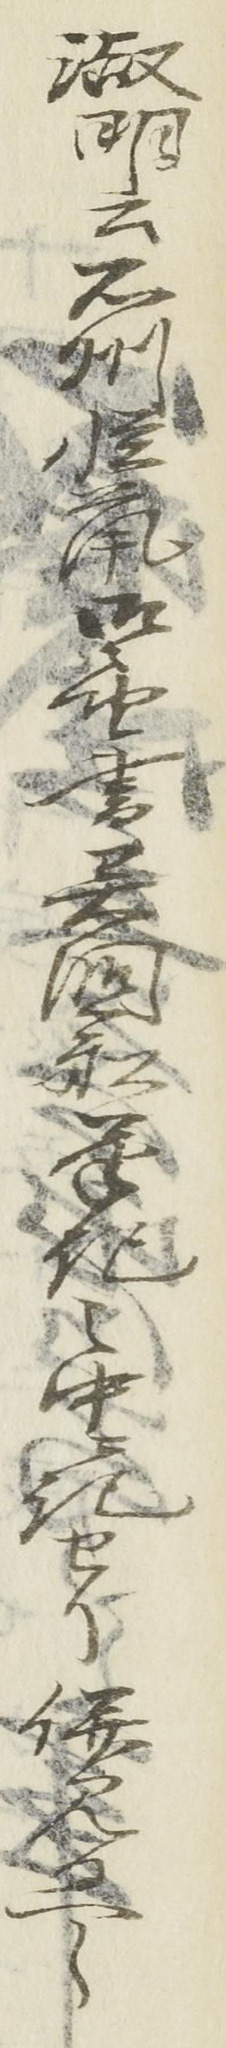淑明云石州怪鼠御届書異国船筆記之中二記せり併見るへし
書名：安政乙卯江戸大地震筆記　安政丙辰八月大阪大雷雨之記追加　安政三辰年七月松前辺大地震并八月大風雨記録
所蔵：東京大学地震研究所図書室 Earthquake Research Institute Library, The University of Tokyo, JAPAN
